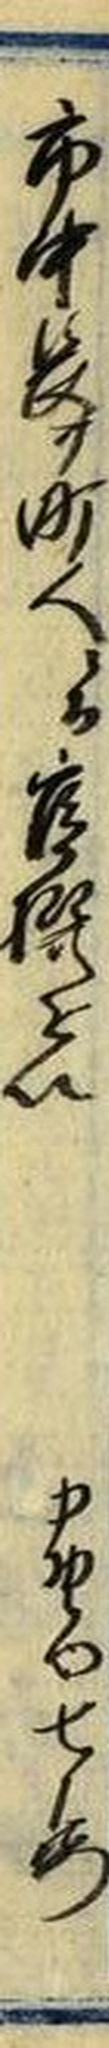市中長サ町人に而官撰を以中野や七右衛門
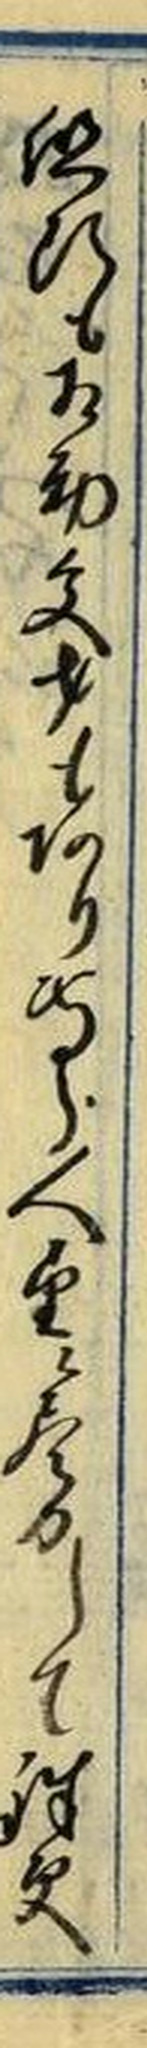組頭も相勤文才もあり専ら人望に尽力して殊更
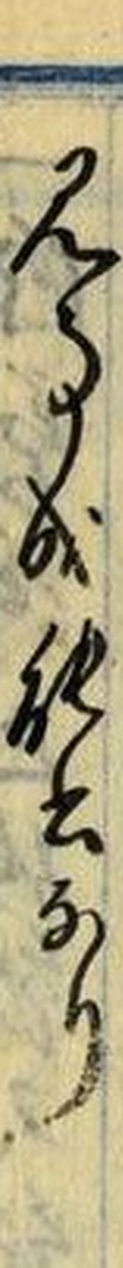見事成能書なり
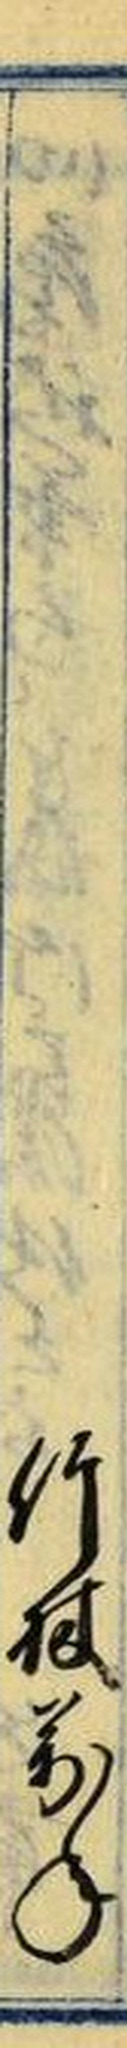竹林万年
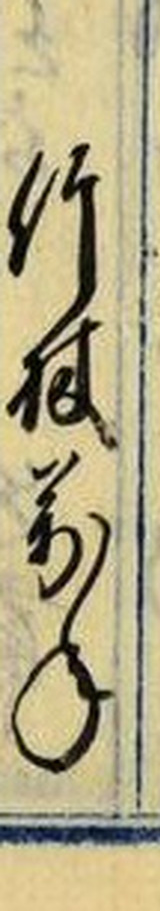竹林万年
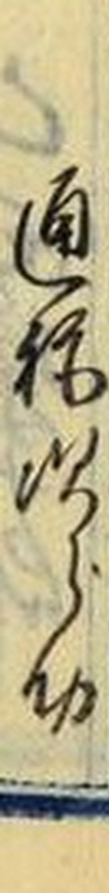通称次郎助
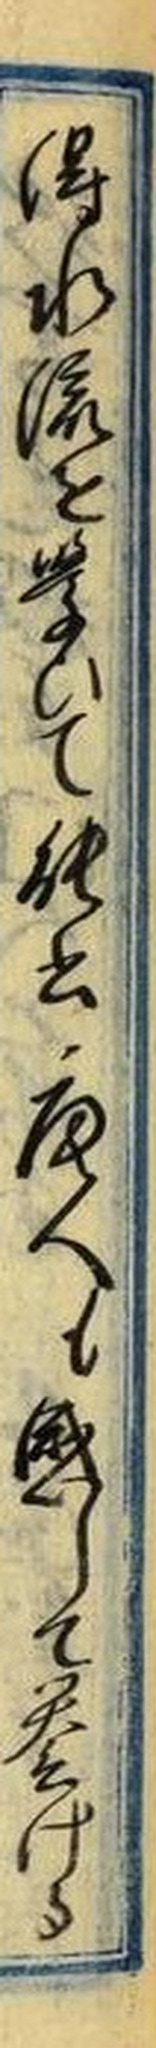得水流を学ひて能書唐人も感して誉ける
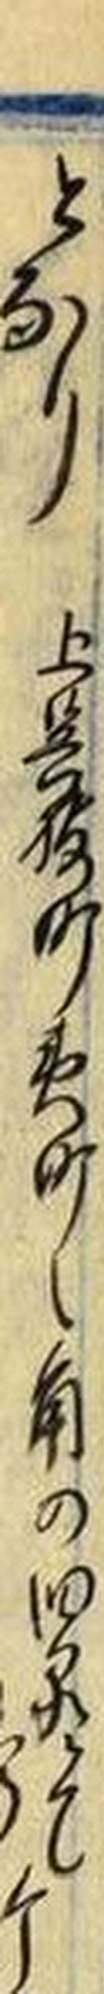となり上呉板町夷町之角の旧家にて
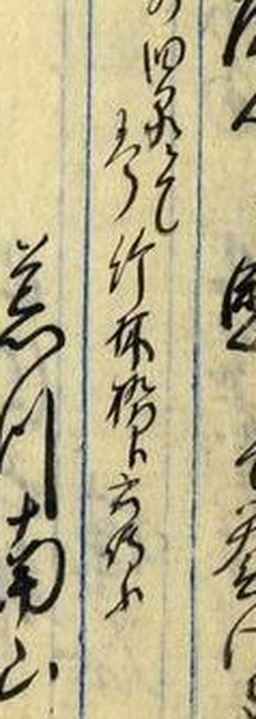于今竹林橋と言伝ふ
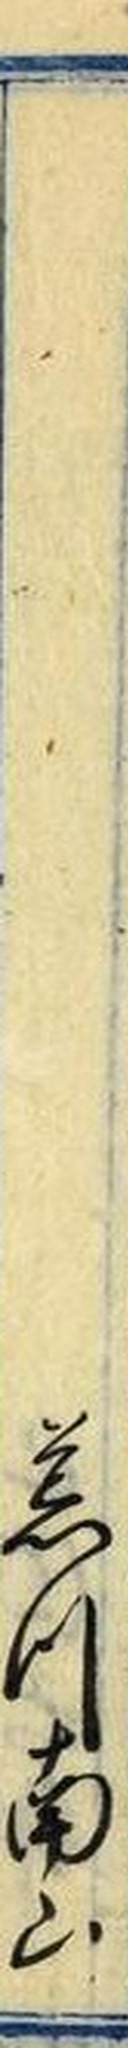荒川南山
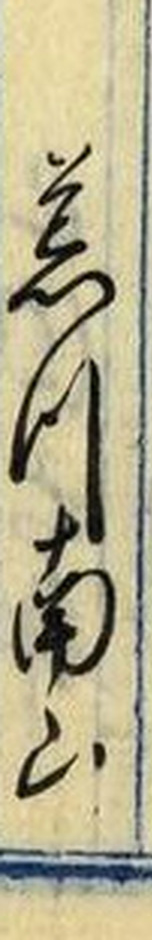荒川南山
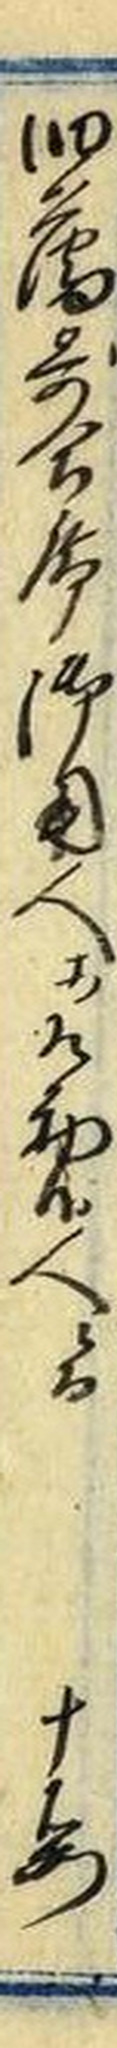旧藩寄合席御用人等取勤候人に而十右衛門
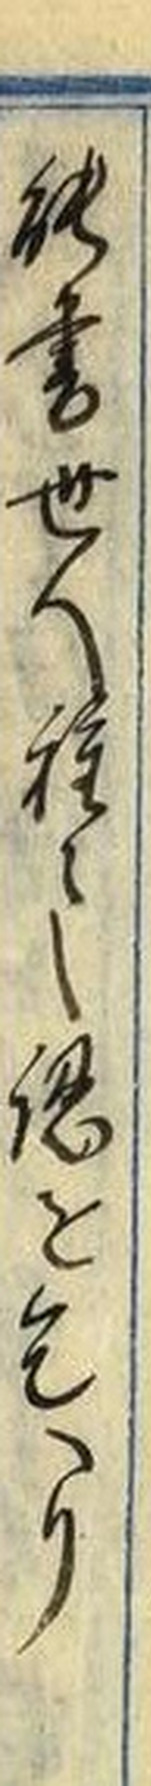能書世人種々之認を乞へり
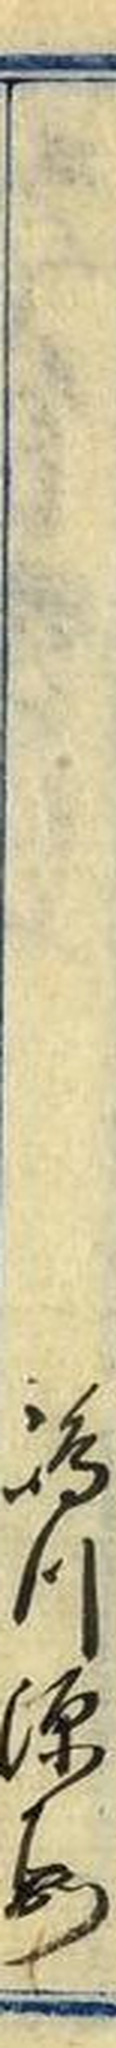嶋川源右衛門
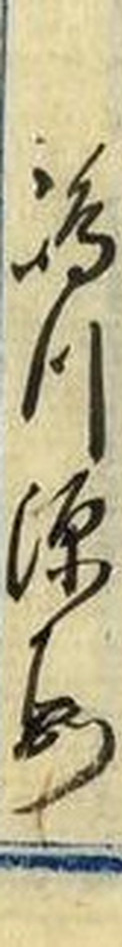嶋川源右衛門
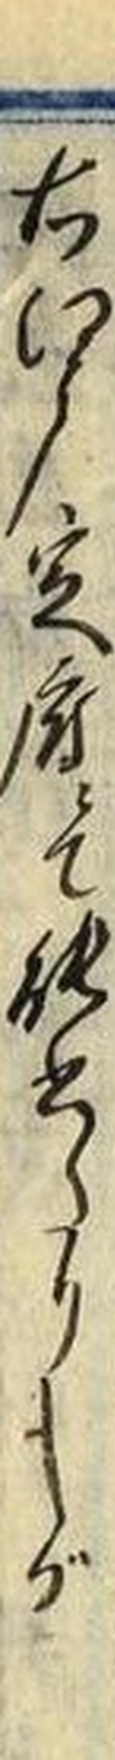右江戸定府にて能書たりしが
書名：温古集 四巻
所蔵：福井県文書館 Fukui Prefectural Archives
